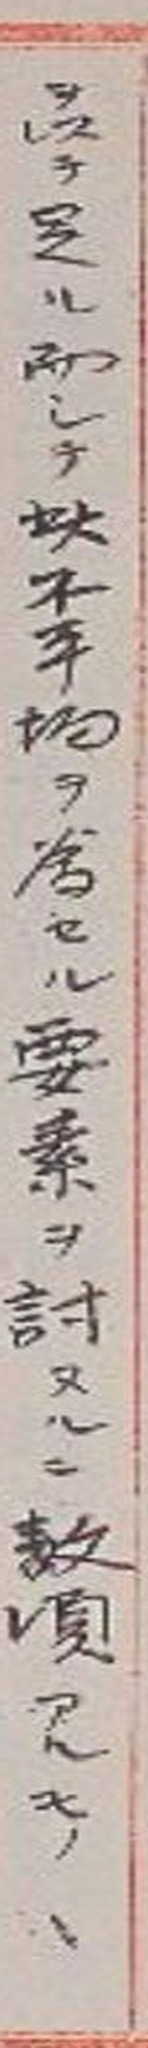ヲ以テ足ル而シテ此不平均ヲ為セル要素ヲ討ヌルニ数項アルモノヽ
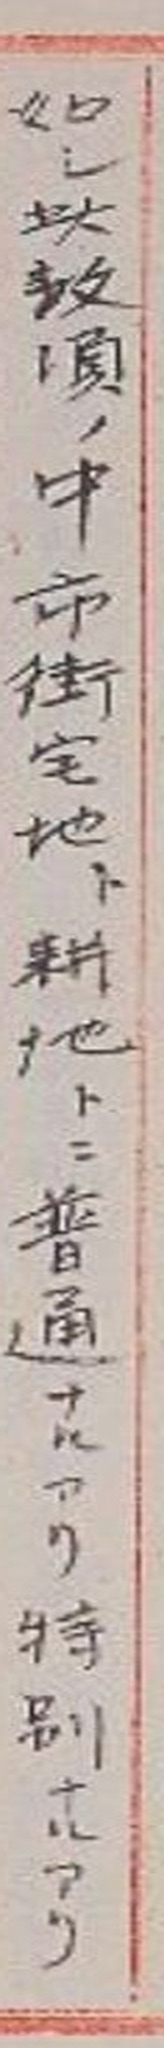如シ此数項ノ中市街宅地ト耕地トニ普通ナルアリ特別ナルアリ
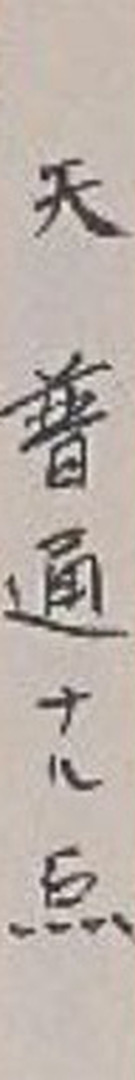天普通ナル点
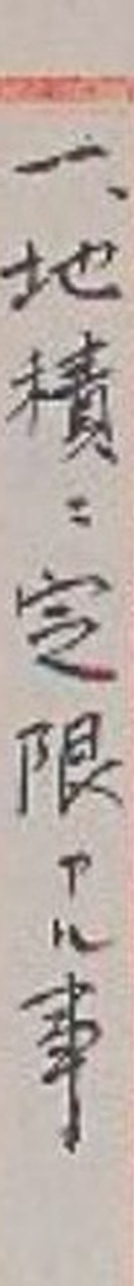一、地積ニ定限アル事
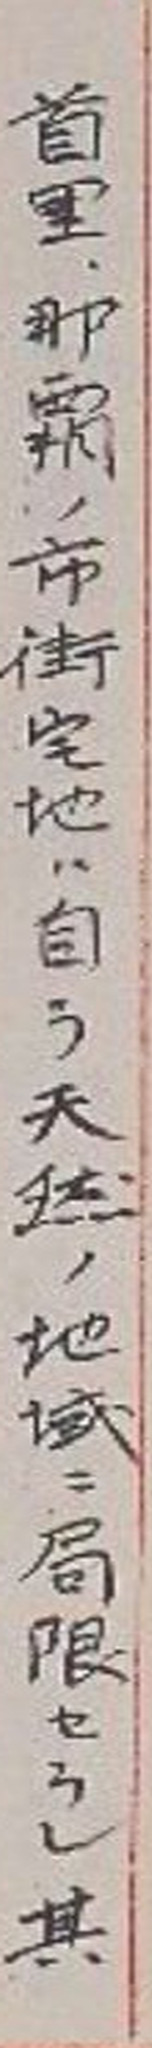首里、那覇ノ市街宅地ハ自ラ天然ノ地域ニ局限セラレ其
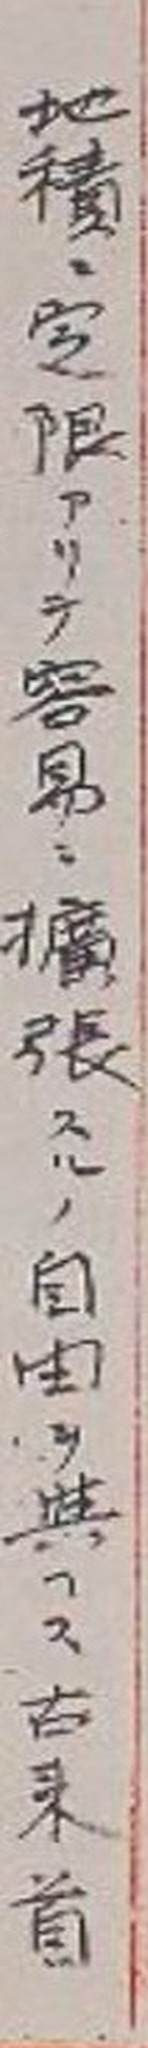地積ニ定限アリテ容易ニ拡張スルノ自由ヲ与ヘス古来首
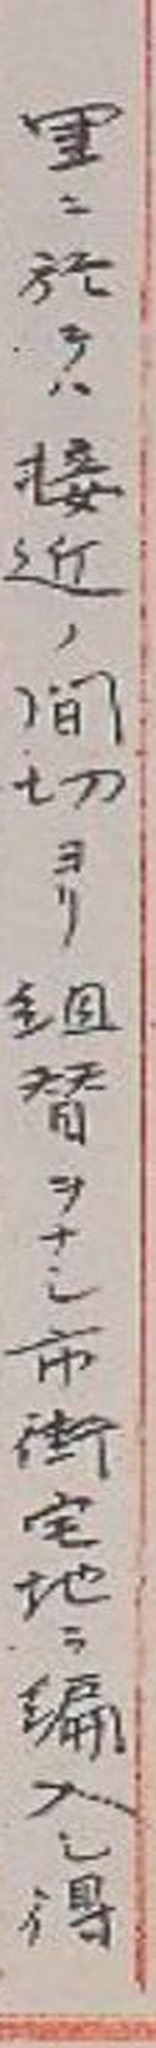里ニ於テハ接近ノ間切ヨリ組替ヲナシ市街宅地ニ編入シ得
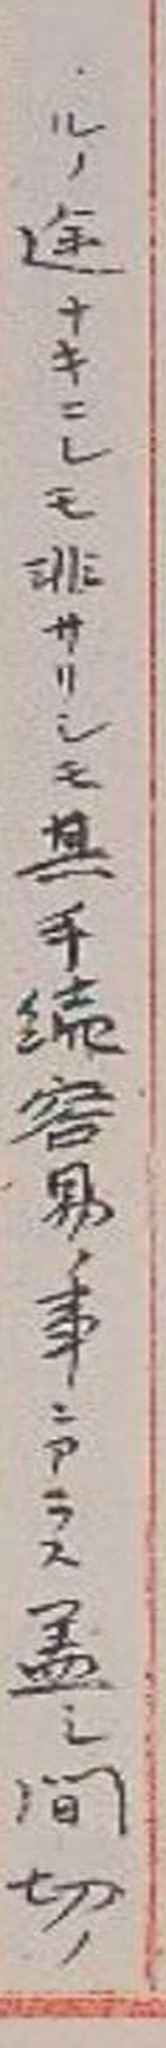ルノ途ナキニシモ非サリシモ其手続容易ノ事ニアラス蓋シ間切ノ

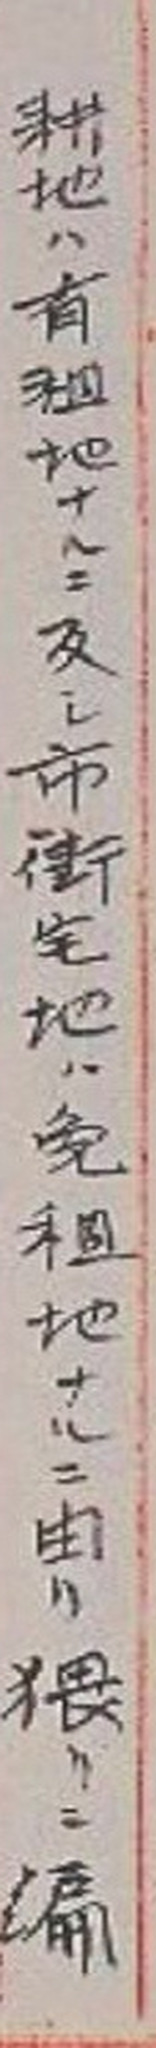耕地ハ有租地ナルニ反シ市街宅地ハ免租地ナルニ由リ猥リニ編
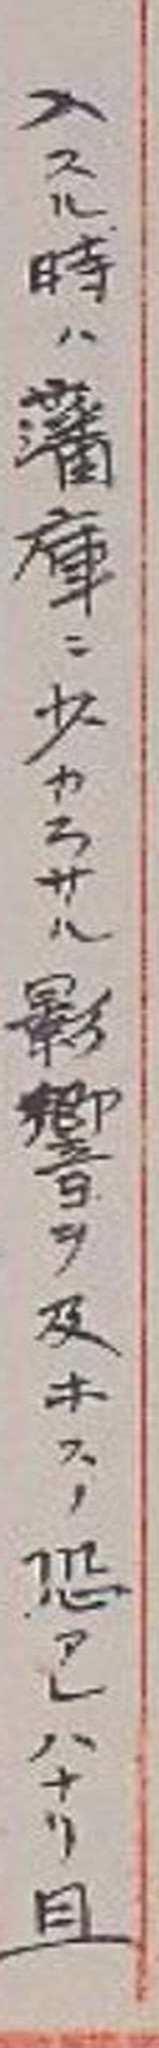入スル時ハ藩庫ニ少カラサル影響ヲ及ホスノ恐アレハナリ且
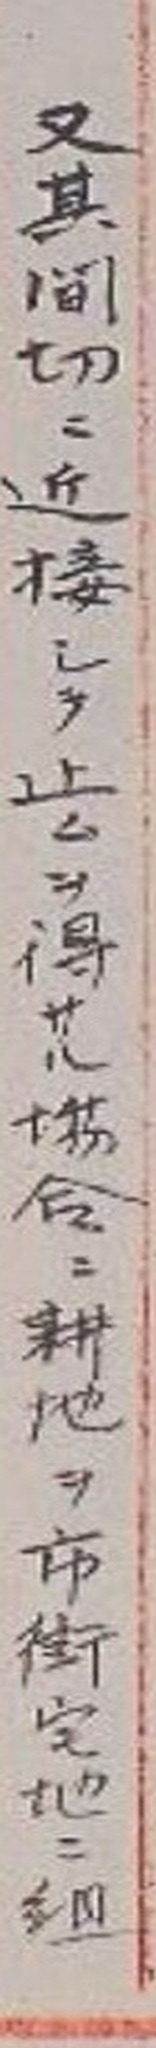又其間切ニ近接シテ止ムヲ得サル場合ニ耕地ヲ市街宅地ニ組
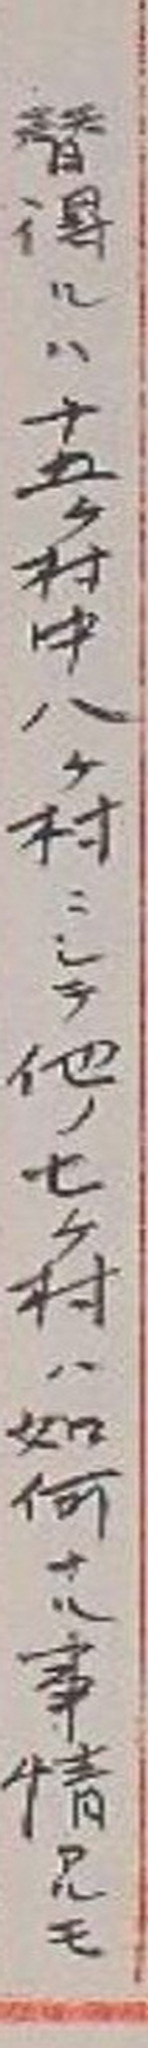替得ルハ十五ヶ村中八ヶ村ニシテ他ノ七ヶ村ハ如何ナル事情アルモ
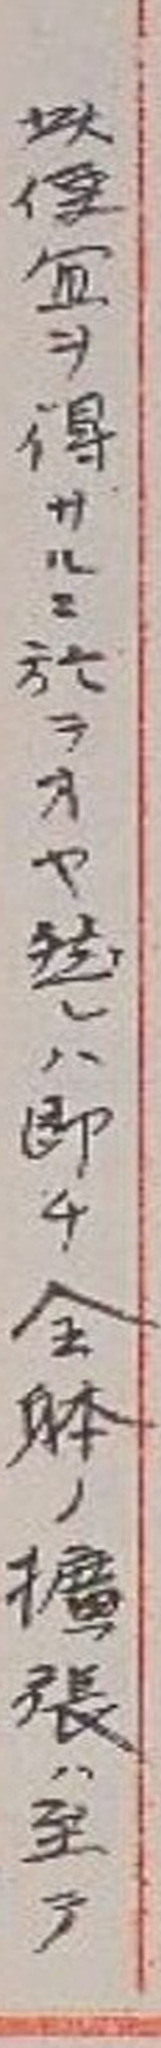此便宜ヲ得サルニ於テオヤ然レハ即チ全体ノ拡張ハ至テ
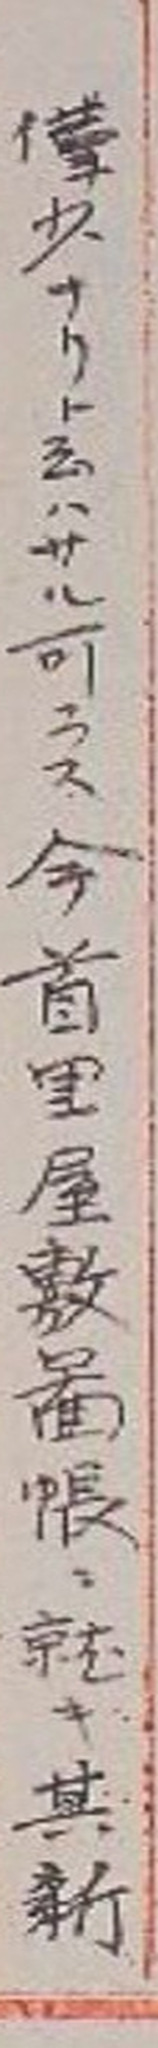僅少ナリト云ハサル可ラス今首里屋敷図帳ニ就キ其新
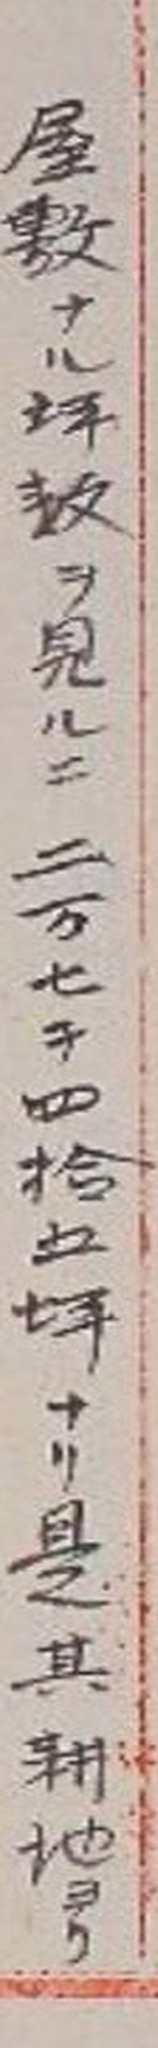屋敷ナル坪数ヲ見ルニ二万七千四拾五坪ナリ是其耕地ヨリ
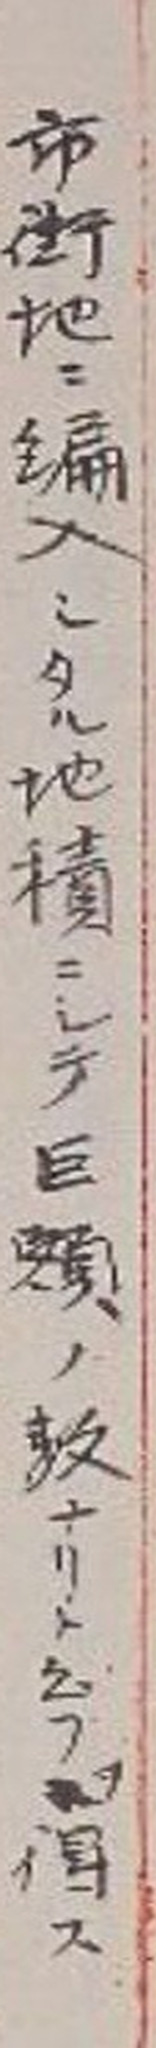市街地ニ編入シタル地積ニシテ巨額ノ数ナリト云フヲ得ス
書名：本県地価ノ高キ理由調書
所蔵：University of the Ryukyus Library
